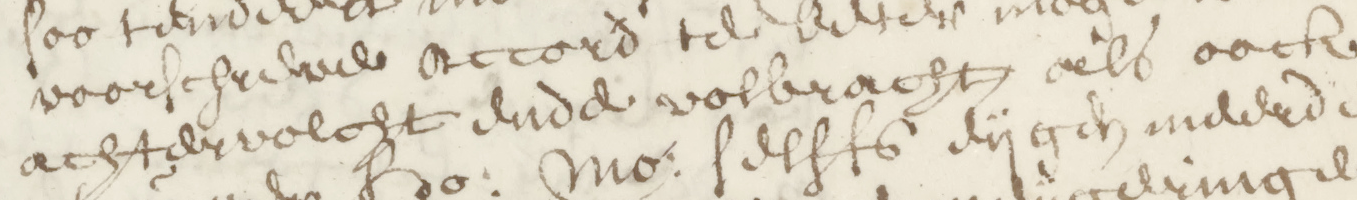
achtervolcht ende volbracht, als oock
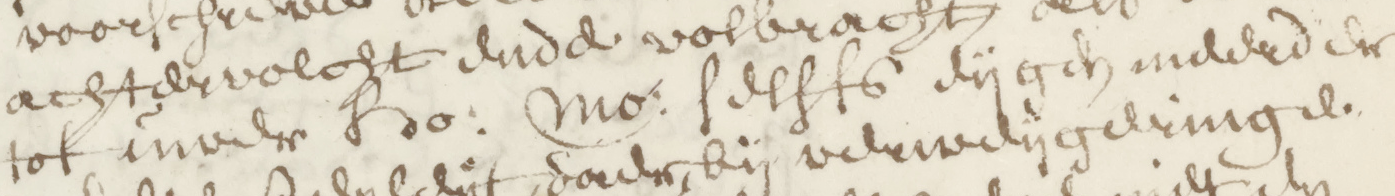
tot uwer Ho:Mo: selffs eijgen meerder
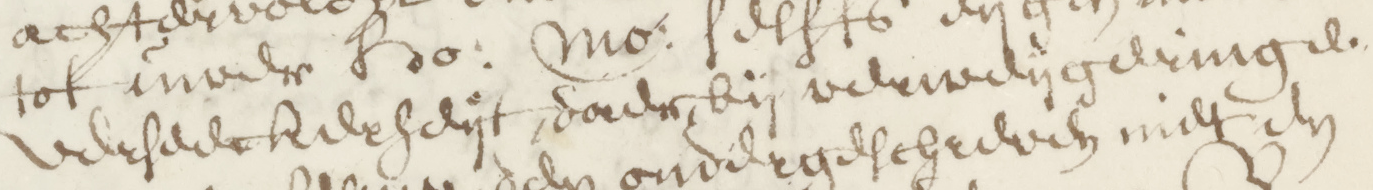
verseeckerheijt, daerbij verweijgeringe
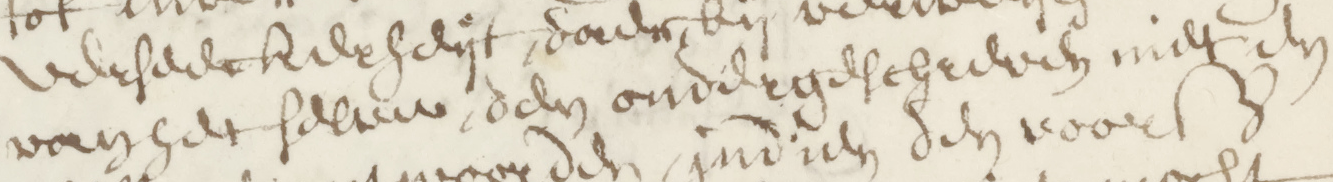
van hetselve, den ondergeschreven niet en
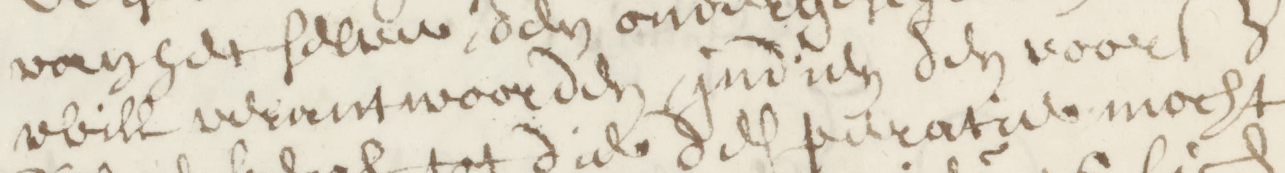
will verantwoorden, indien den voors
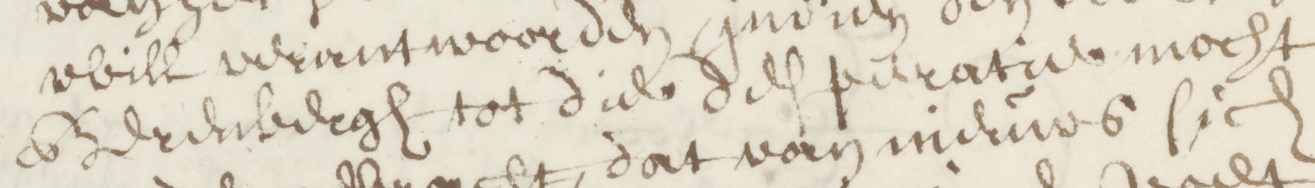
Berenbergh tot die desperatie mocht
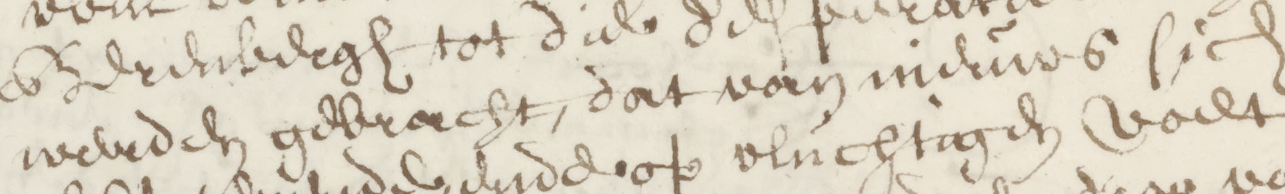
werden gebracht, dat van nieuws sich
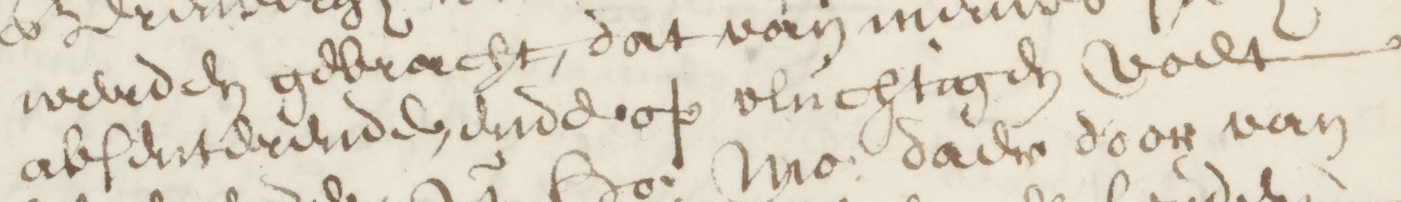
absenterende, ende op vluchtigen voet
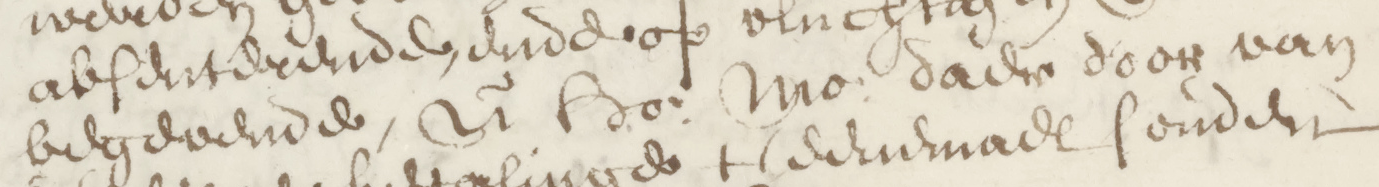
begevende, U Ho:Mo: daer door van
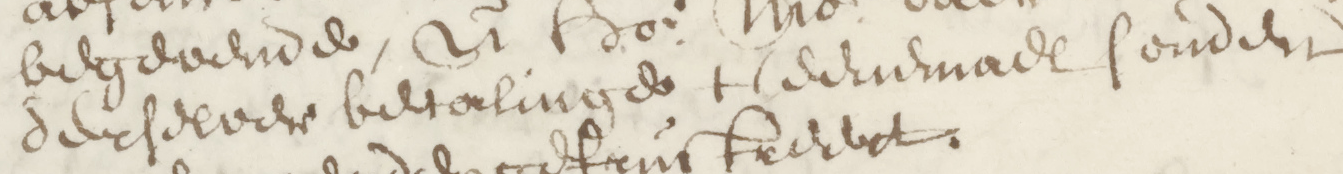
derselver betalinge t‛eenemael souden
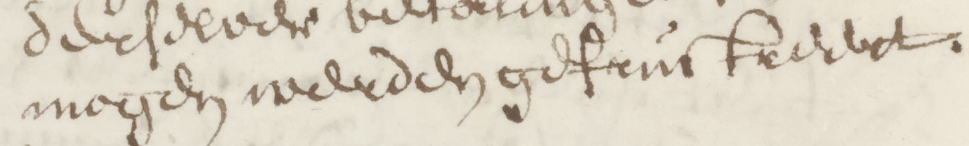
mogen werden gefrustreert.
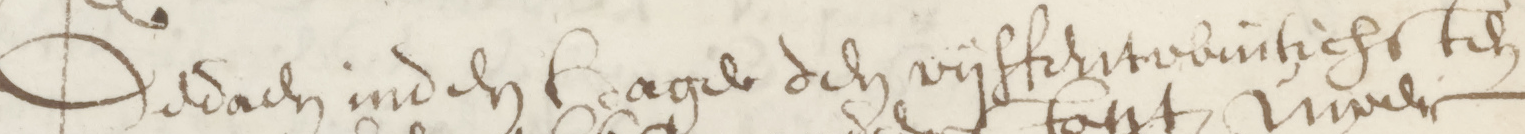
Gedaen inden Hage den vijffentwintichsten
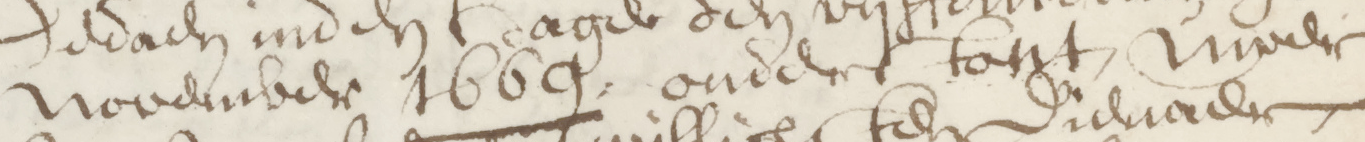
November 1669. onderstont, Uwer
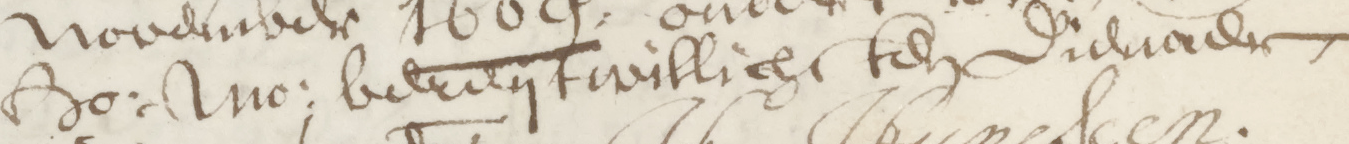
Ho:Mo: bereijtwillichsten Dienaer,
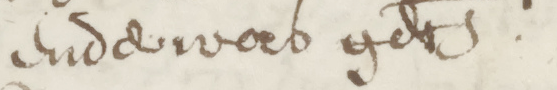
ende was get. H. Huneken.
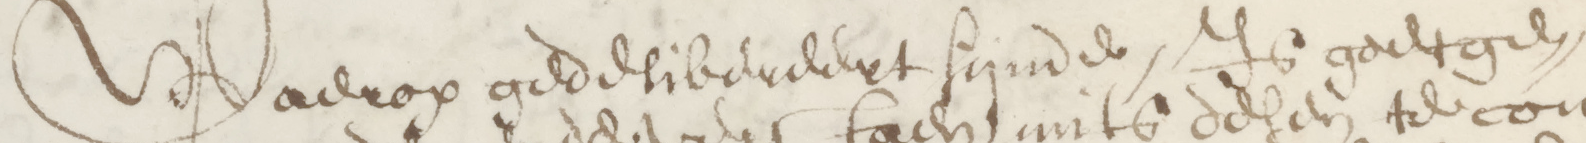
Waerop gedelibereert sijnde, Is goetge„
